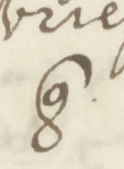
Ca
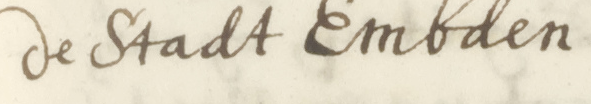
de Stadt Embden.
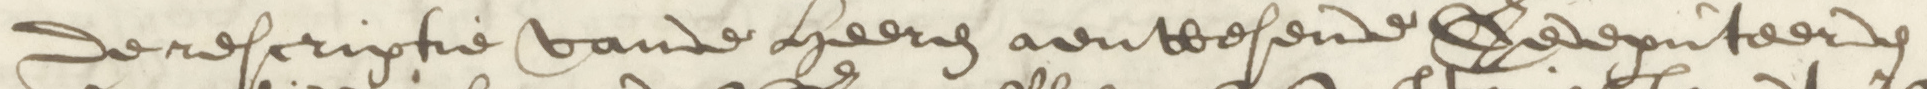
De rescriptie vande heeren aenwesende Gedeputeerden
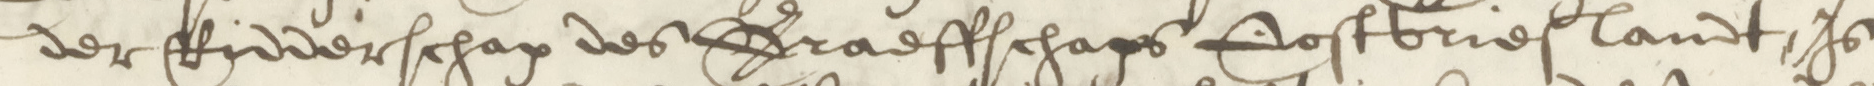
der Ridderschap des Graeffschaps Oostvrieslandt, Is
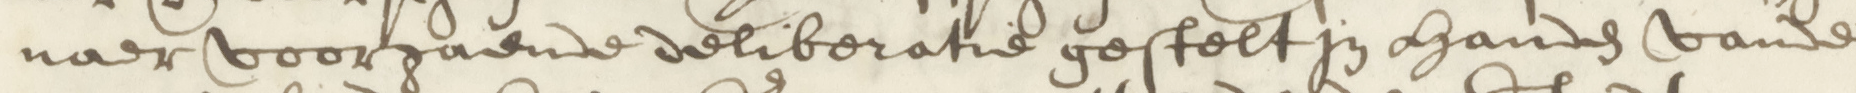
naer voorgaende deliberatie gestelt in handen vande
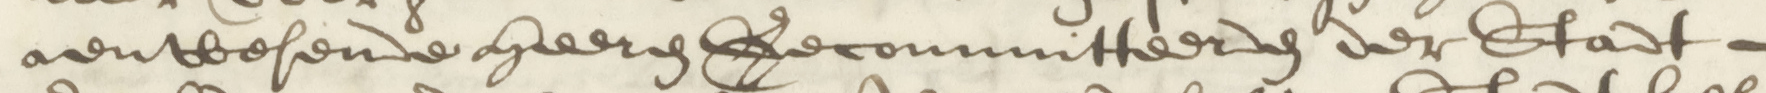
aenwesende heeren Gecommitteerden der Stadt —
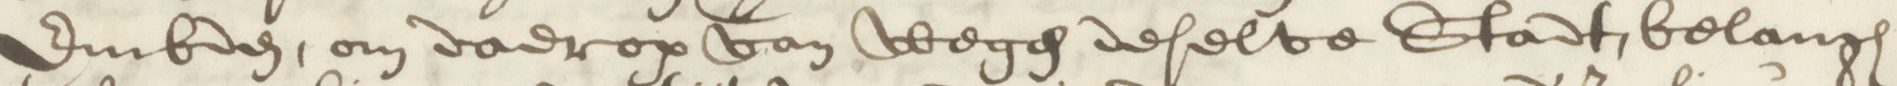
Embden, om daerop van wegen deselve Stadt, belangh
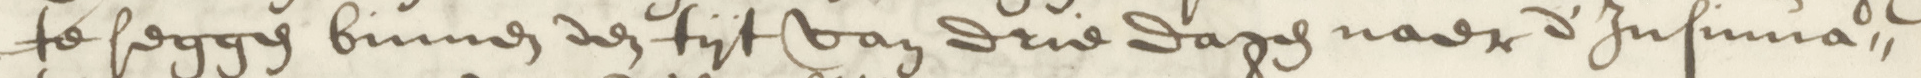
te seggen binnen den tijt van drie Dagen naer d'Insinua„
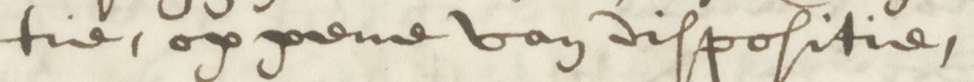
tie, op pene van dispositie.
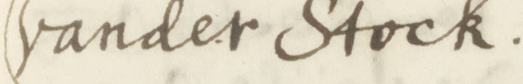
Vander Stock.
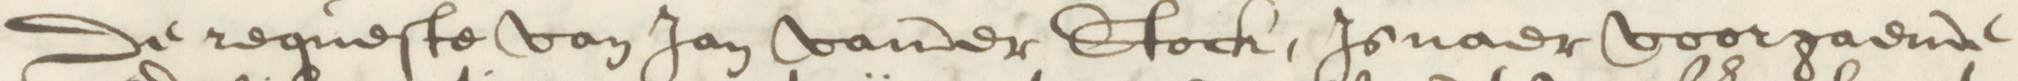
De requeste van Jan vander Stock, Is naer voorgaende
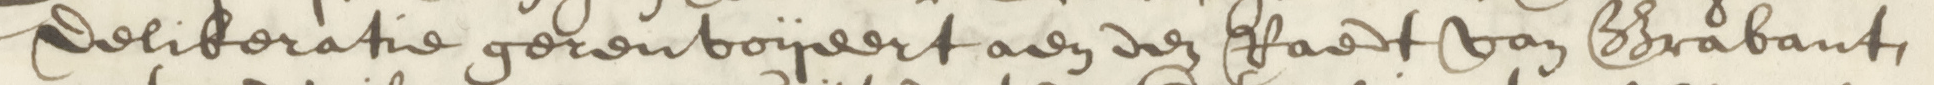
deliberatie gerenvoijeert aen den Raedt van Brabant,
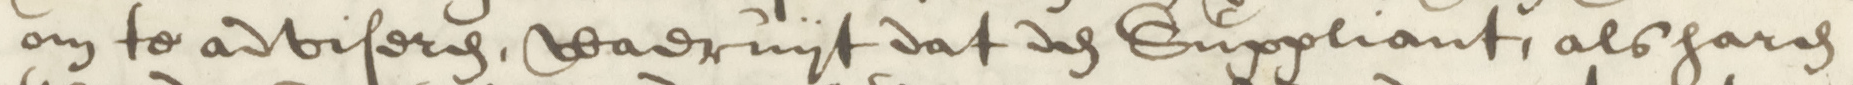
om te adviseren, waeruijt dat den Suppliant, als haren
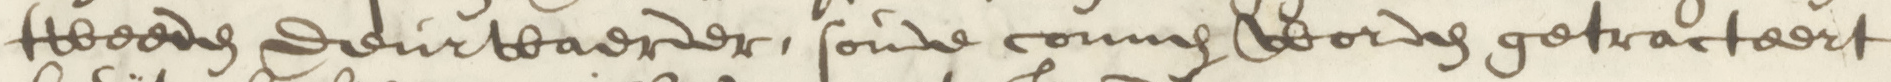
tweeden Deurwaerder, soude connen worden getracteert
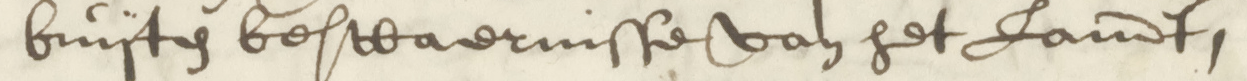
buijten beswaernisse van het Landt.
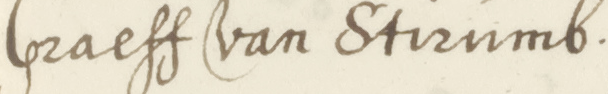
Graeff van Stirumb:
